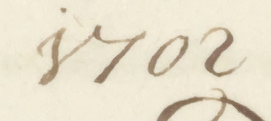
1702
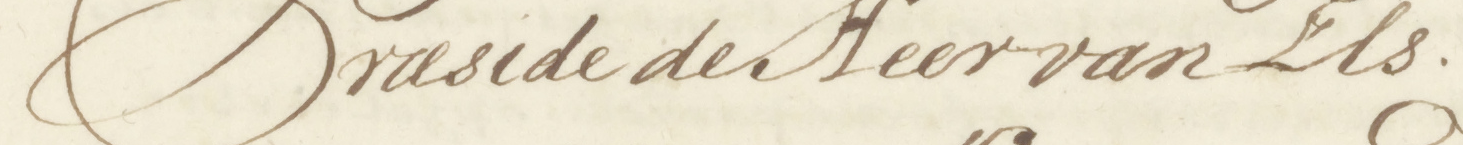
Præside de Heer van Els.
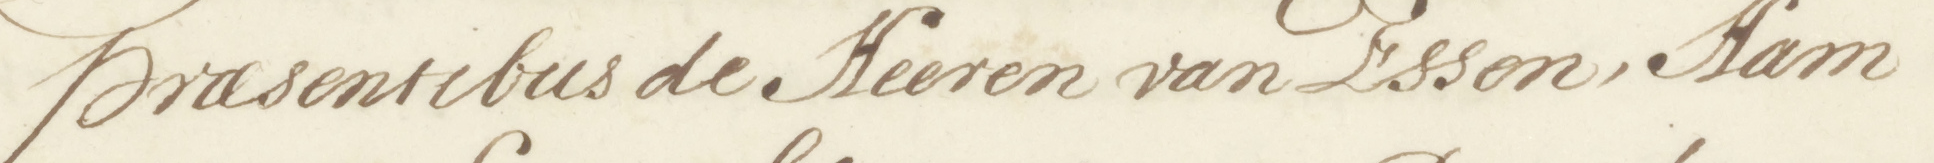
Præsentibus de Heeren van Essen, Ham
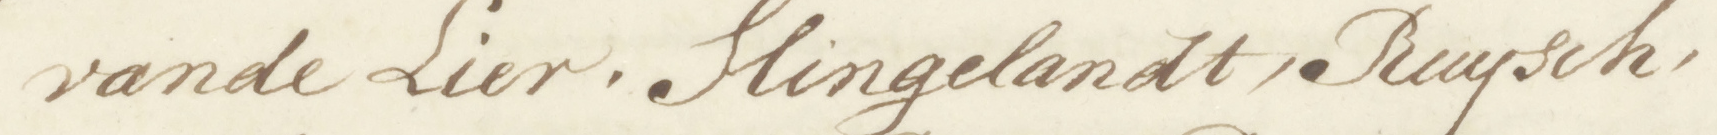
vande Lier, Slingelandt, Ruysch,
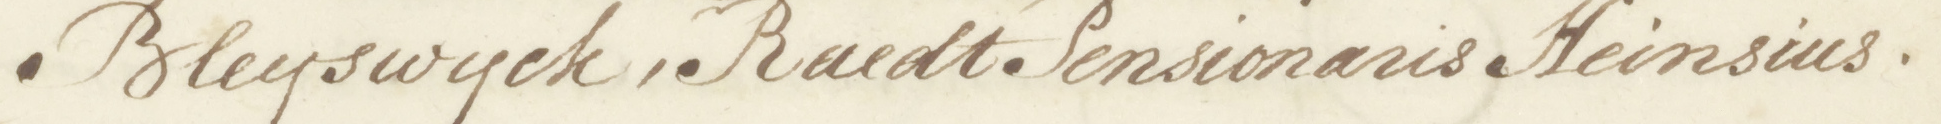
Bleyswyck, Raedt Pensionaris Heinsius,
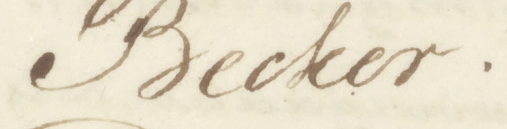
Becker.
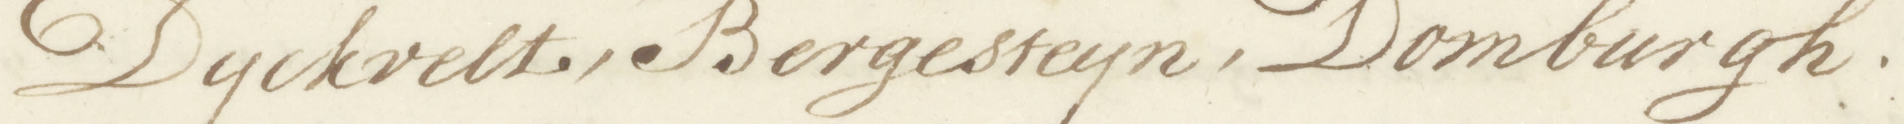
Dijckvelt, Bergesteijn, Domburgh.
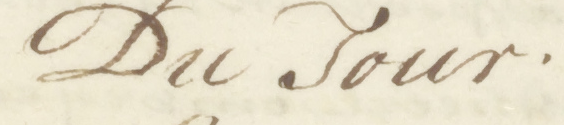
Du Tour.
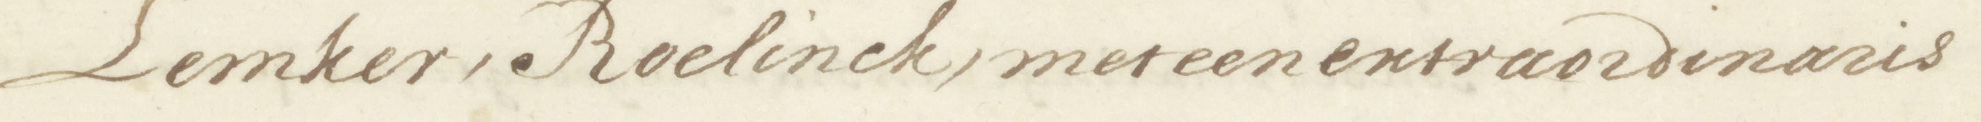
Lemker, Roelinck, met eenextraordinaris
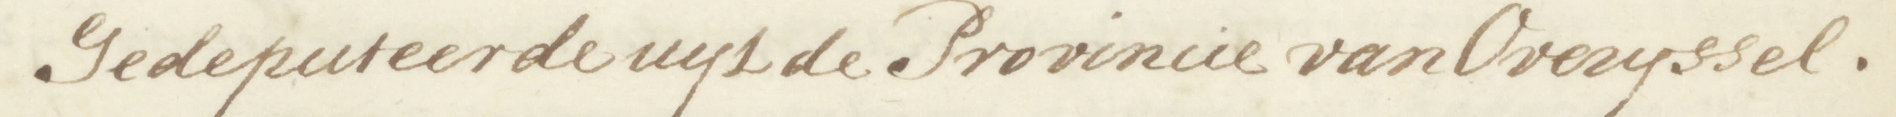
Gedeputeerde uijt de Provincie van Overijssel.
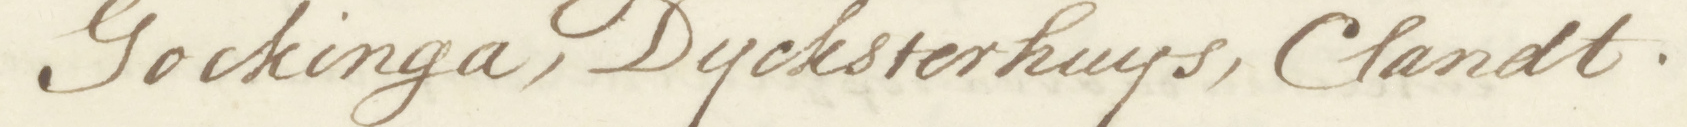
Gockinga, Dijcksterhuys, Clandt.
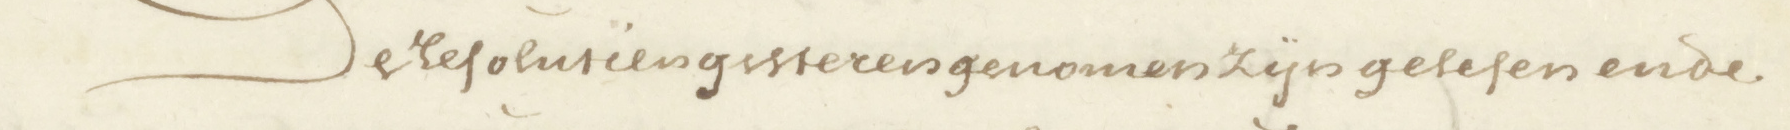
De resolutien gisteren genomen zijn gelesen ende
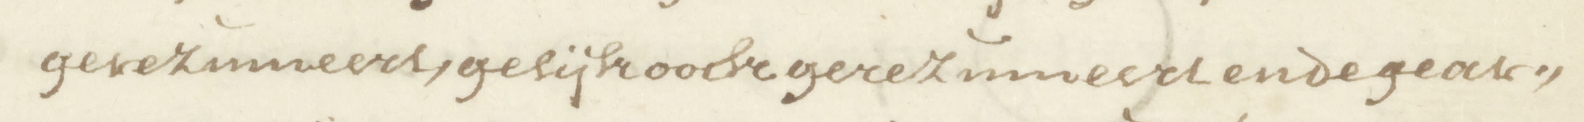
gerezumeert, gelijk oock gerezumeert ende gear„
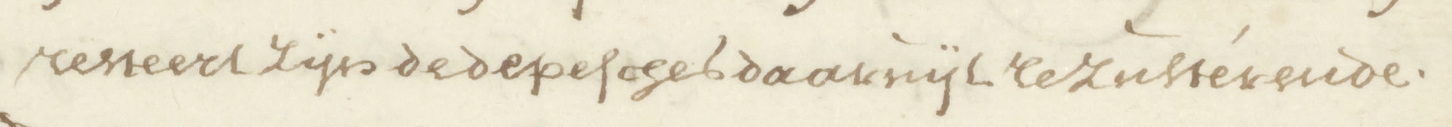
resteert zijn de depesches daaruijt rezulterende
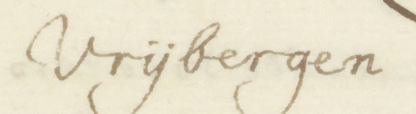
Vrijbergen
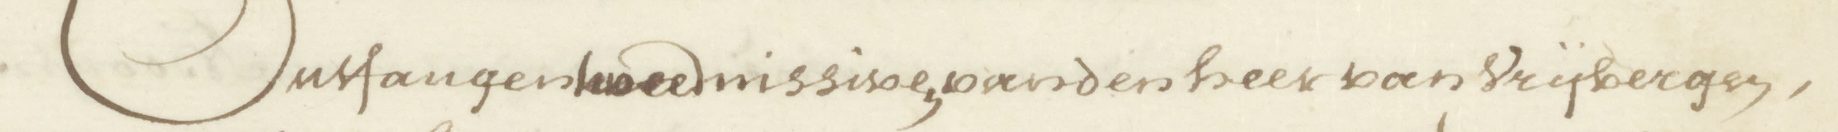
Ontfangen twee missiven van den heer van Vijbergen,
